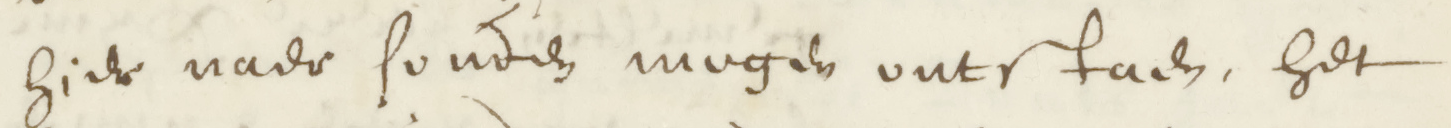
hier naer souden mogen ontstaen, het
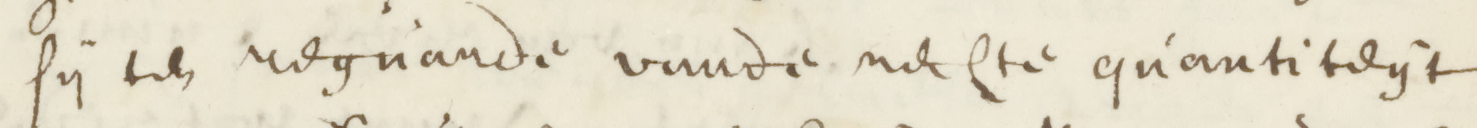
sij ten reguarde vande rechte quantiteijt
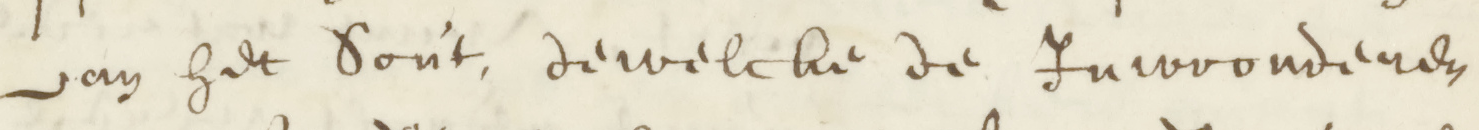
van het Sout, dewelcke de Inwoonderen
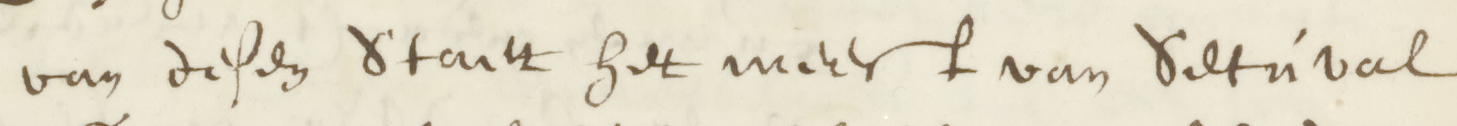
van desen Staet het meest van Setuval
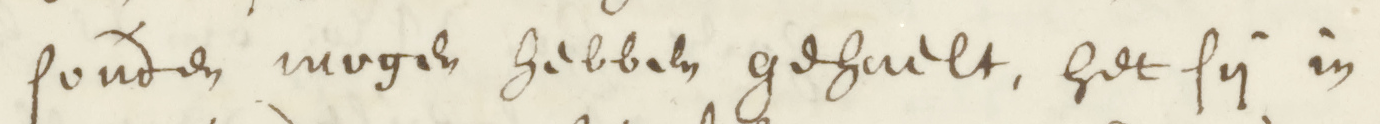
souden mogen hebben gehaelt, het sij in
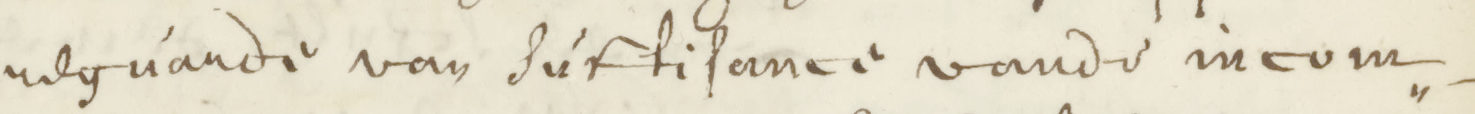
reguarde van suffisance vande incom„
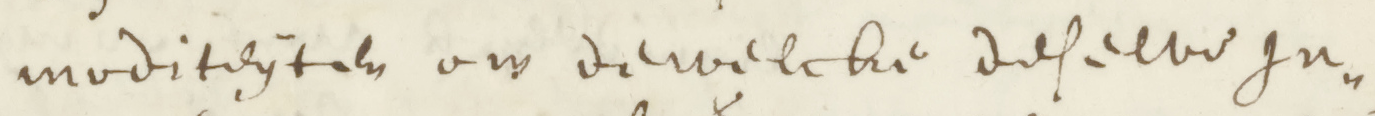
moditeijten om dewelcke deselve In„
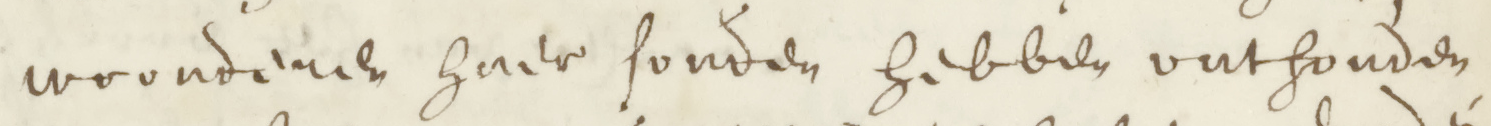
woonderen haer souden hebben onthouden
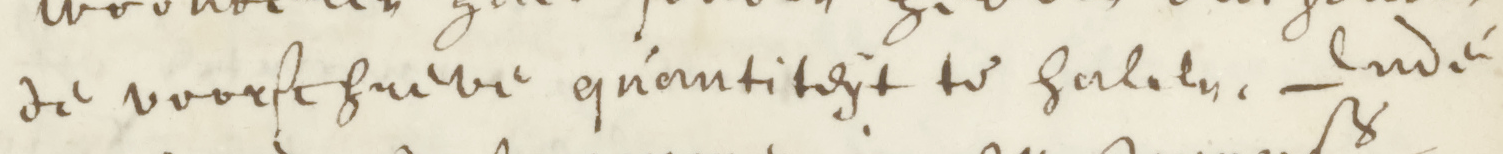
de voorschreve quantiteijt te halen. Ende
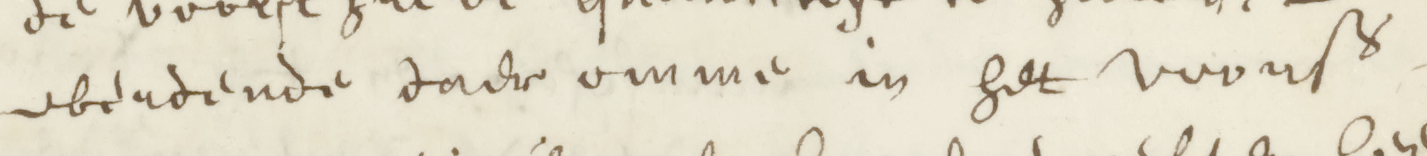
werdende daer omme in het voors
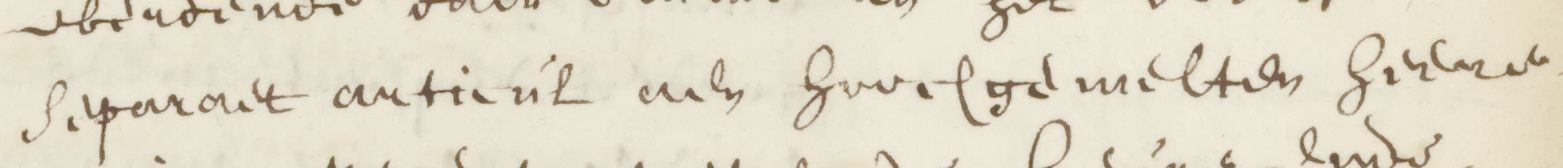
separaet articul aen hoochgemelten heere
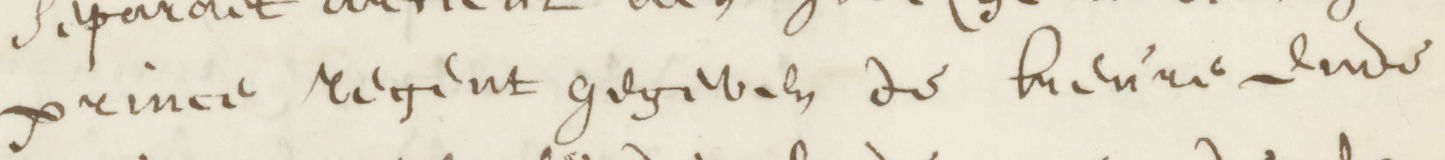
prince regent gegeven de keure ende
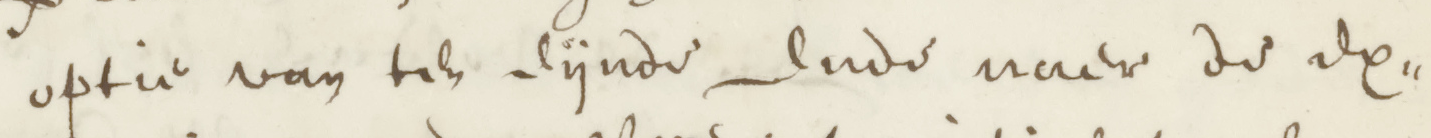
optie van ten eijnde ende naer de ex„
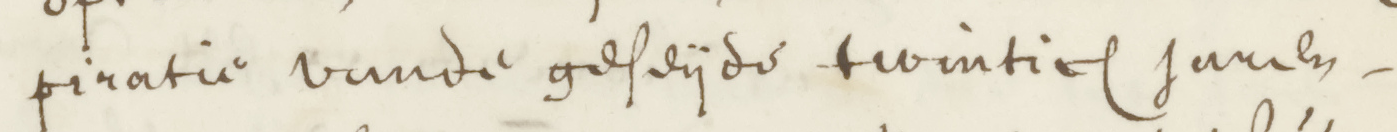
piratie vande geseijde twintich jaren
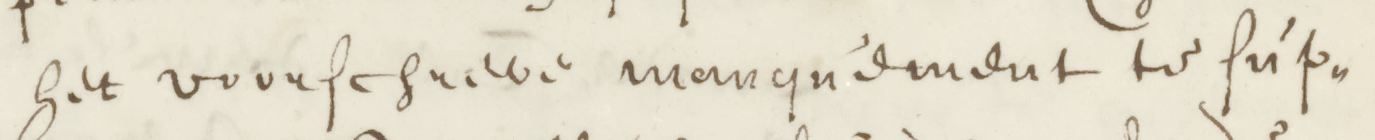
het voorschreve manquement te sup„
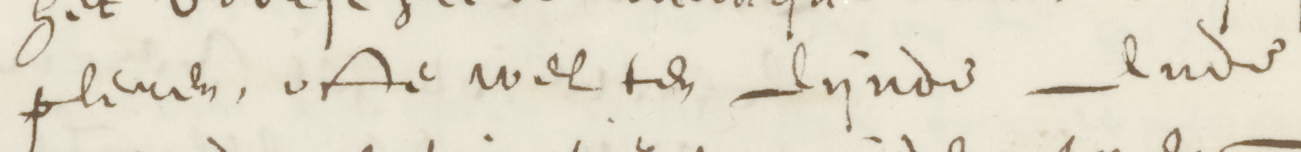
pleren, ofte wel ten eijnde ende
